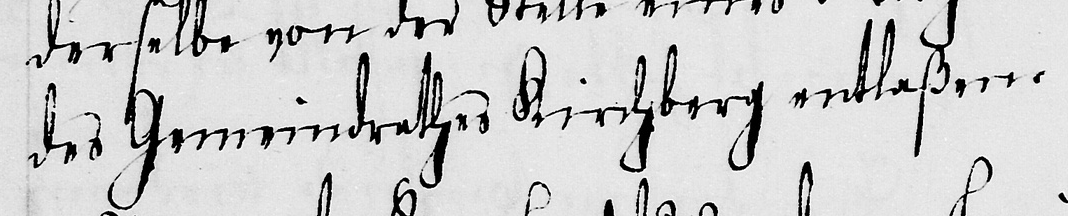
des Gemeindrathes Kirchberg entlaßen.
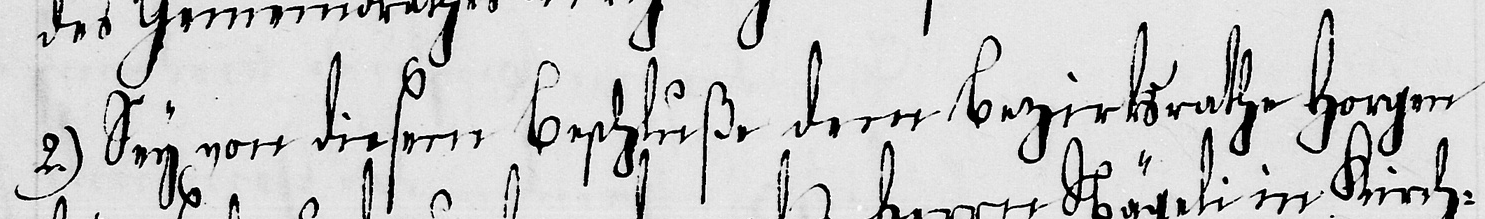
2.) Sey von diesem Beschluße dem Bezirksrathe Horgen
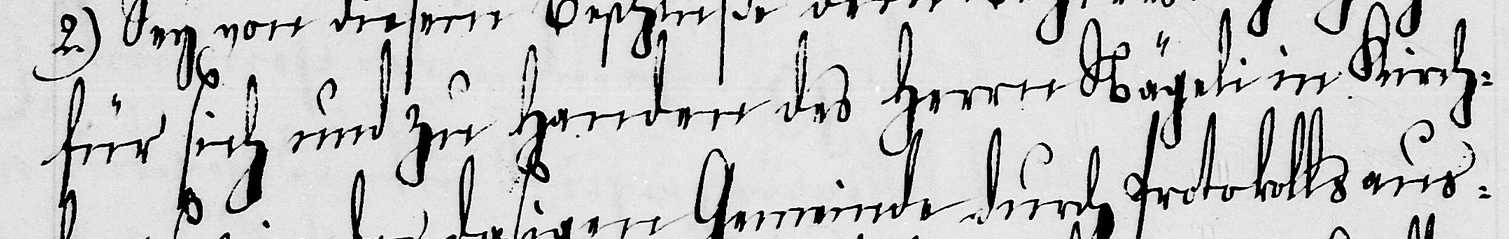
für sich und zu Handen des Herrn Nägeli in Kirch¬
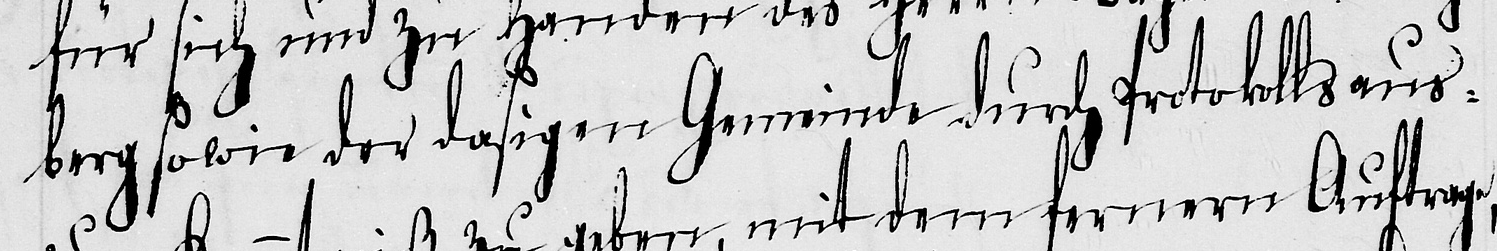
berg sowie der dasigen Gemeinde durch Protokollsaus¬
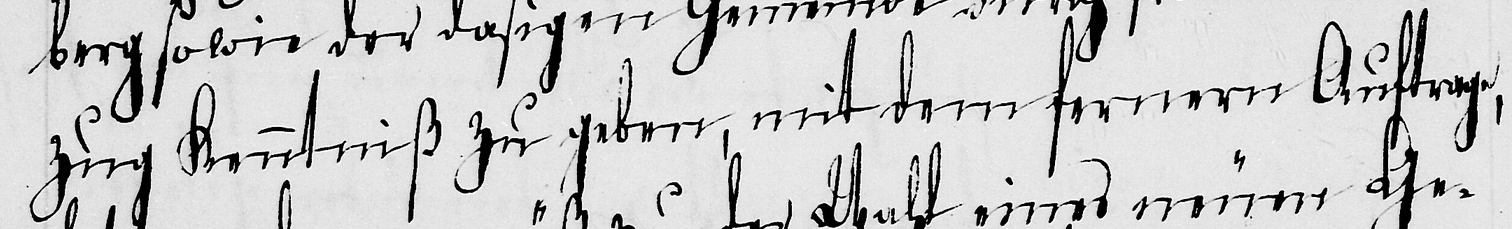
zug Kenntniß zu geben, mit dem ferneren Auftrage,
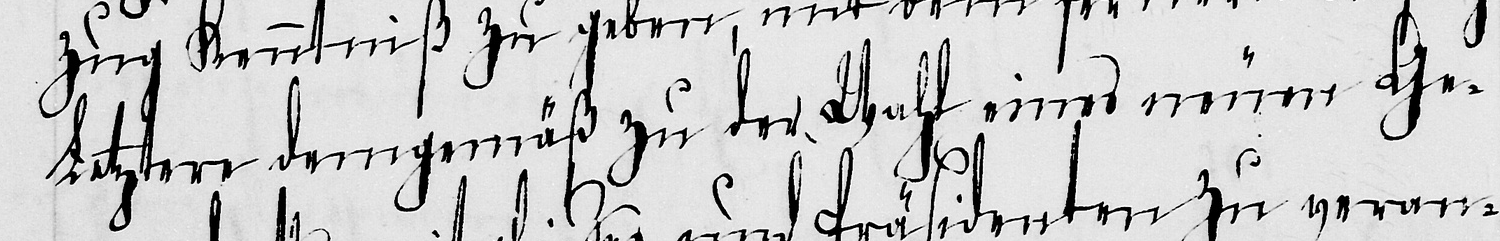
Letztere demgemäß zu der Wahl eines neuen Ge¬
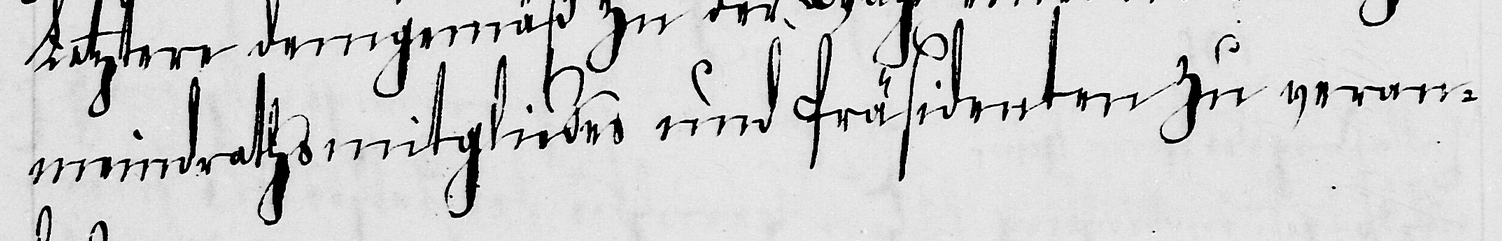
meindrathsmitgliedes und Präsidenten zu veran¬
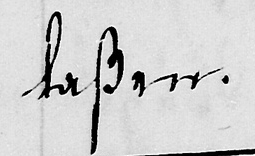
laßen.
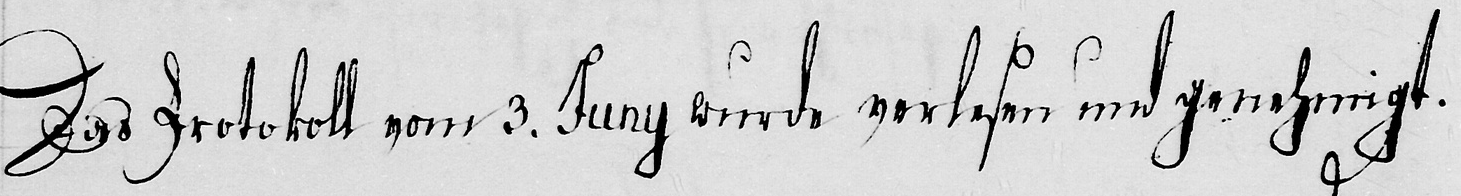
Das Protokoll vom 3. Juny wurde verlesen und genehmigt.
